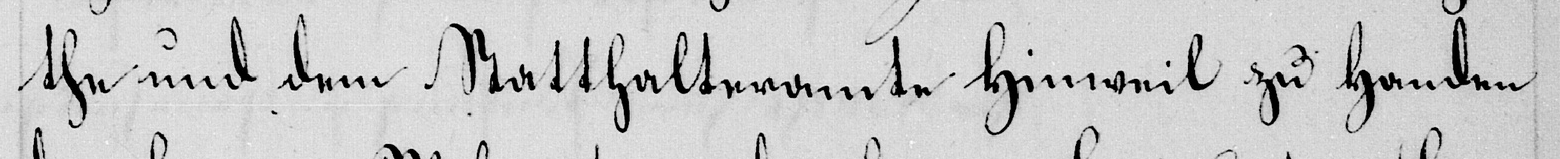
the und dem Statthalteramte Hinweil zu Handen
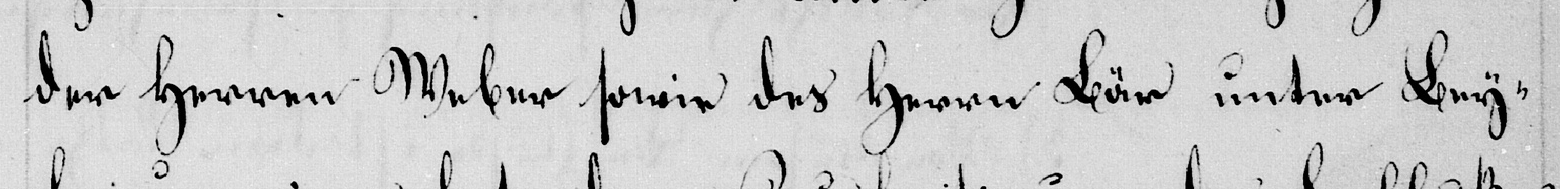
der Herren Weber sowie des Herrn Bär unter Bey¬
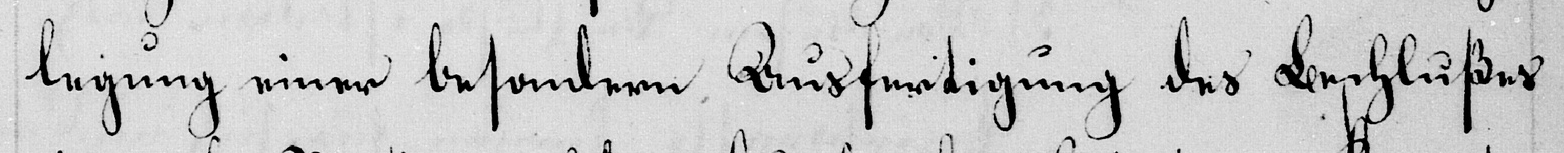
legung einer besondern Ausfertigung des Beschlußes
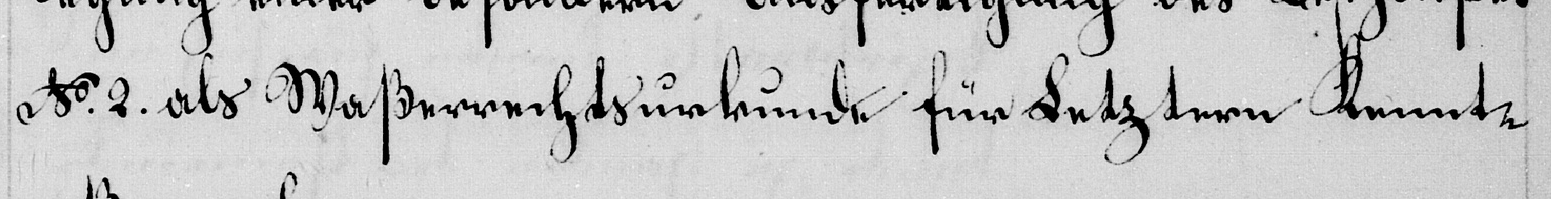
No. 2. als Waßerrechtsurkunde für Letztere Kennt¬
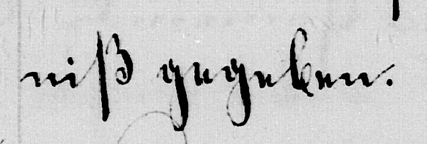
niß gegeben.
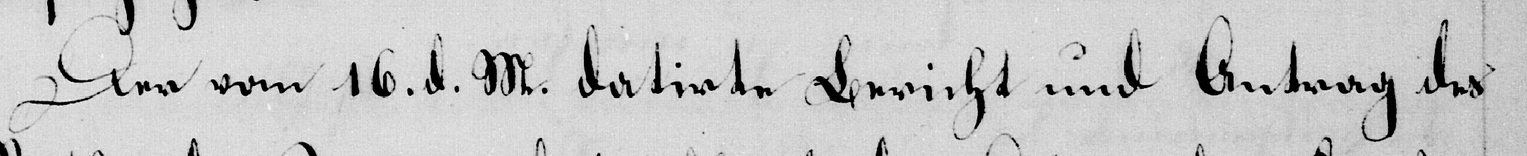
Der vom 16. d. M. datirte Bericht und Antrag des
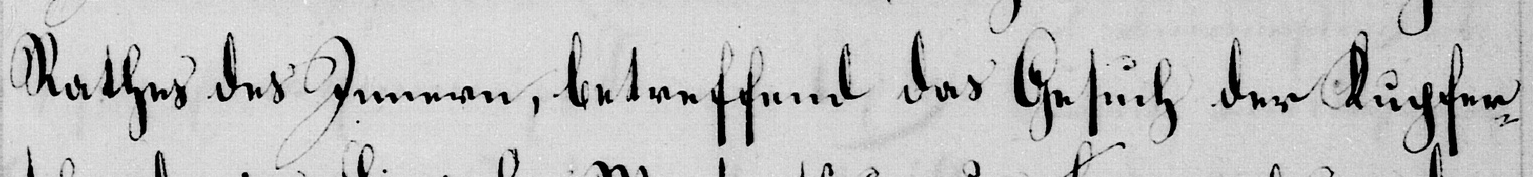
Rathes des Innern, betreffend das Gesuch der Kupfers¬
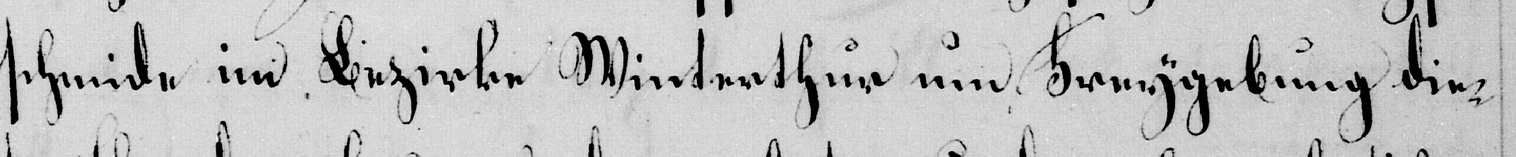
chmide im Bezirke Winterthur um Freygebung dies¬
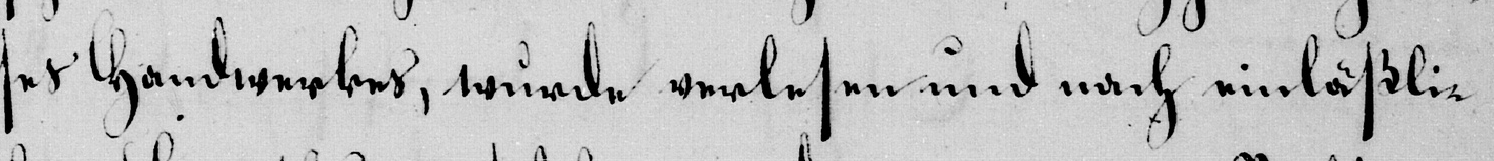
es Handwerkes, wurde verlesen und nach einläßli¬
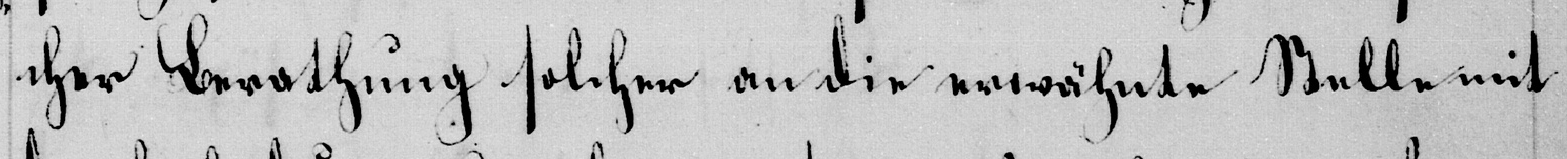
cher Berathung solcher an die erwähnte Stelle mit
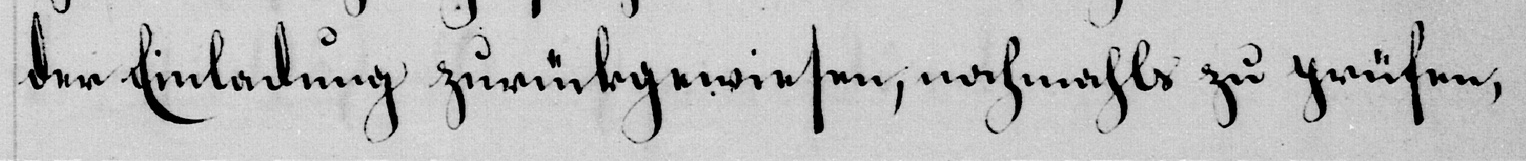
der Einladung zurückgewiesen, nochmahls zu prüfen,
